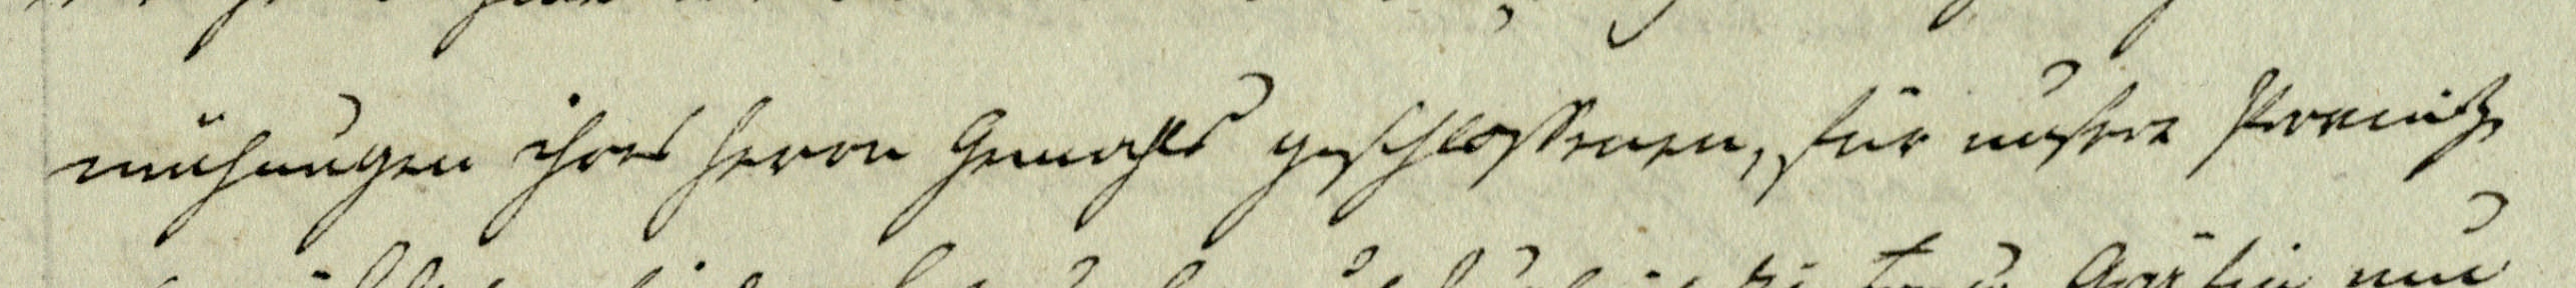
mühungen ihres Herrn Gemahls geschlossenen, für unsere Provinz
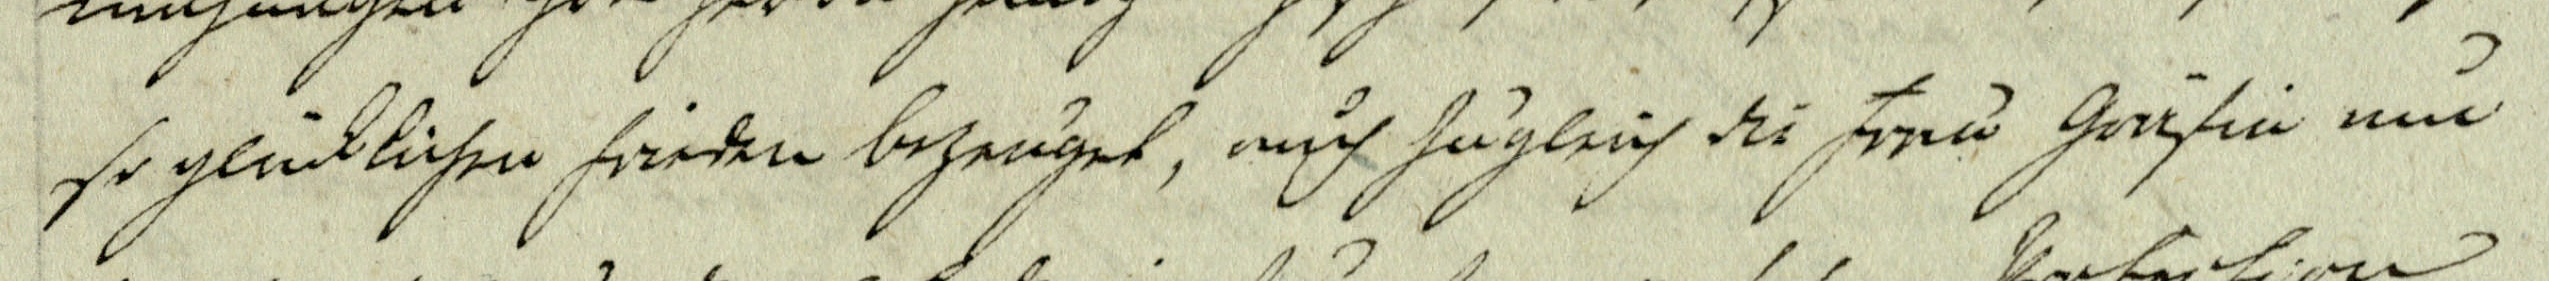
so glücklichen Frieden bezeuget, auch zugleich die Frau Gräfin um
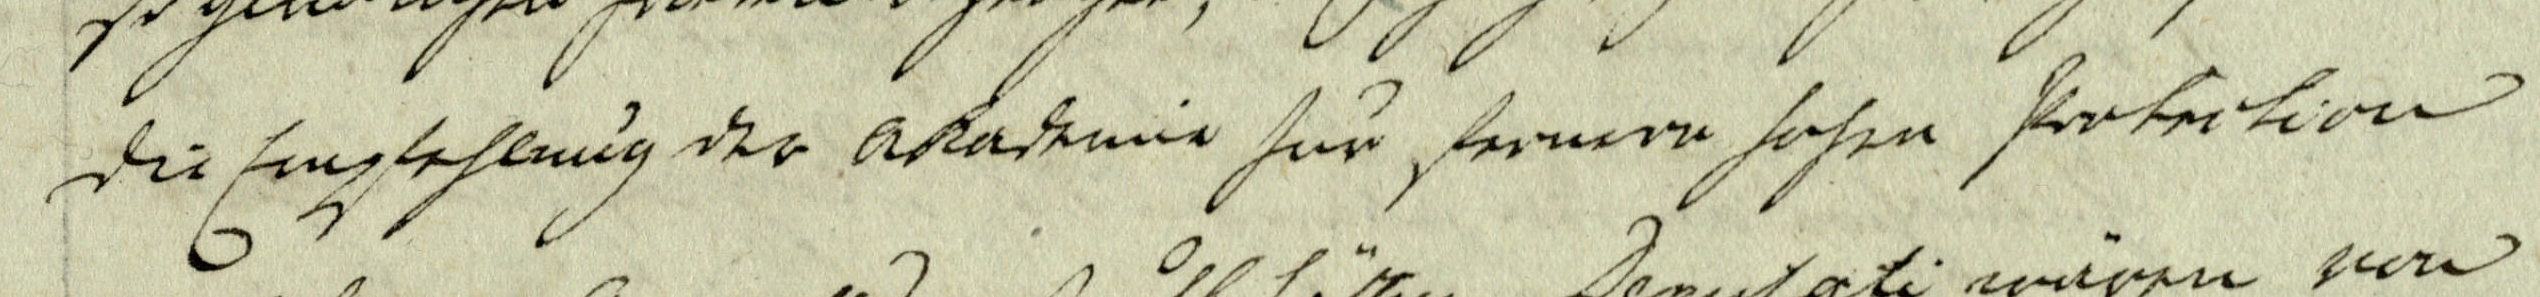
die Empfehlung der Akademie zur fernern hohen Protection
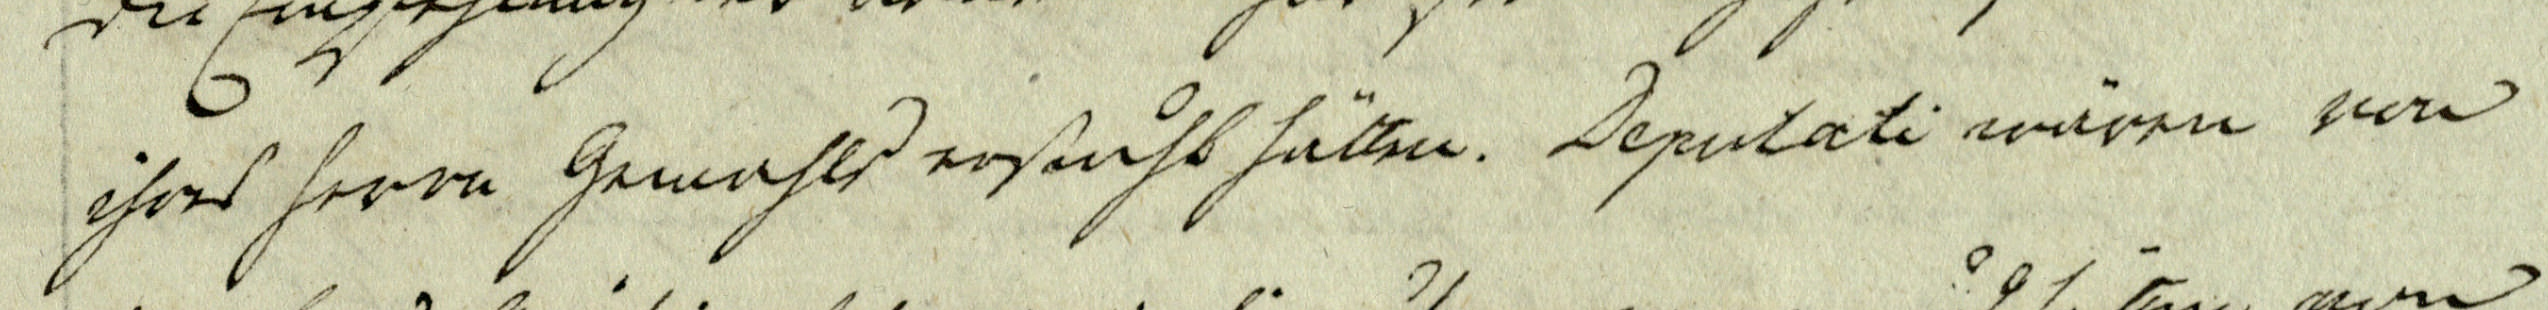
ihres Herrn Gemahls ersucht hätten. Deputati wären von
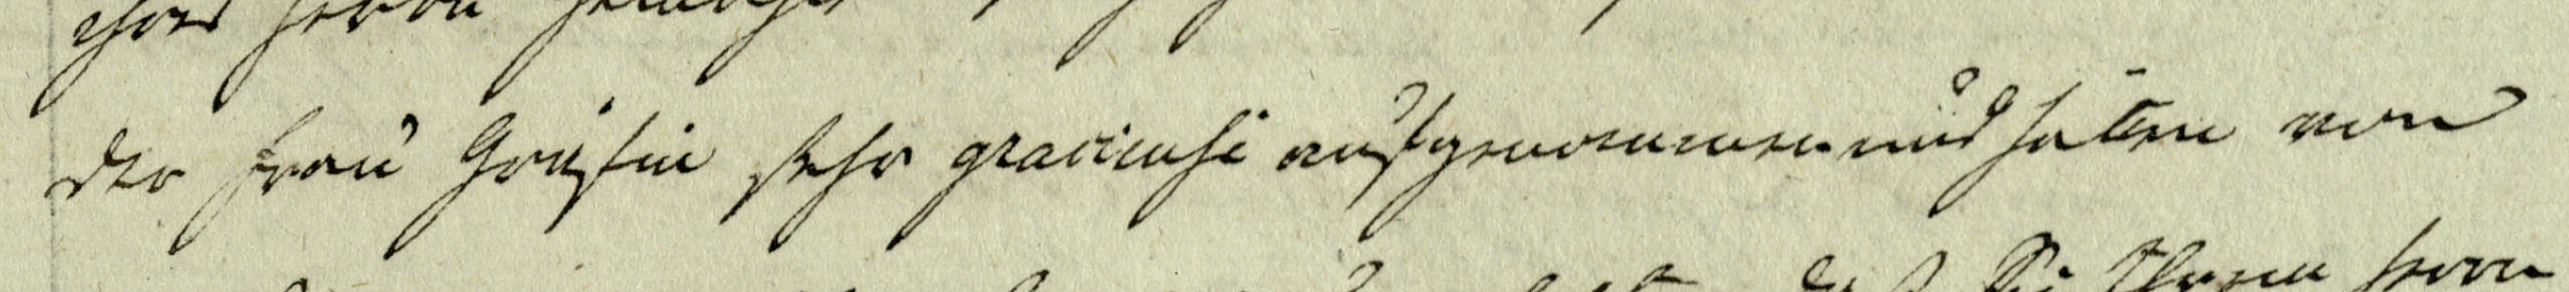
der Frau Gräfin sehr gracieuse aufgenommen und hätten von
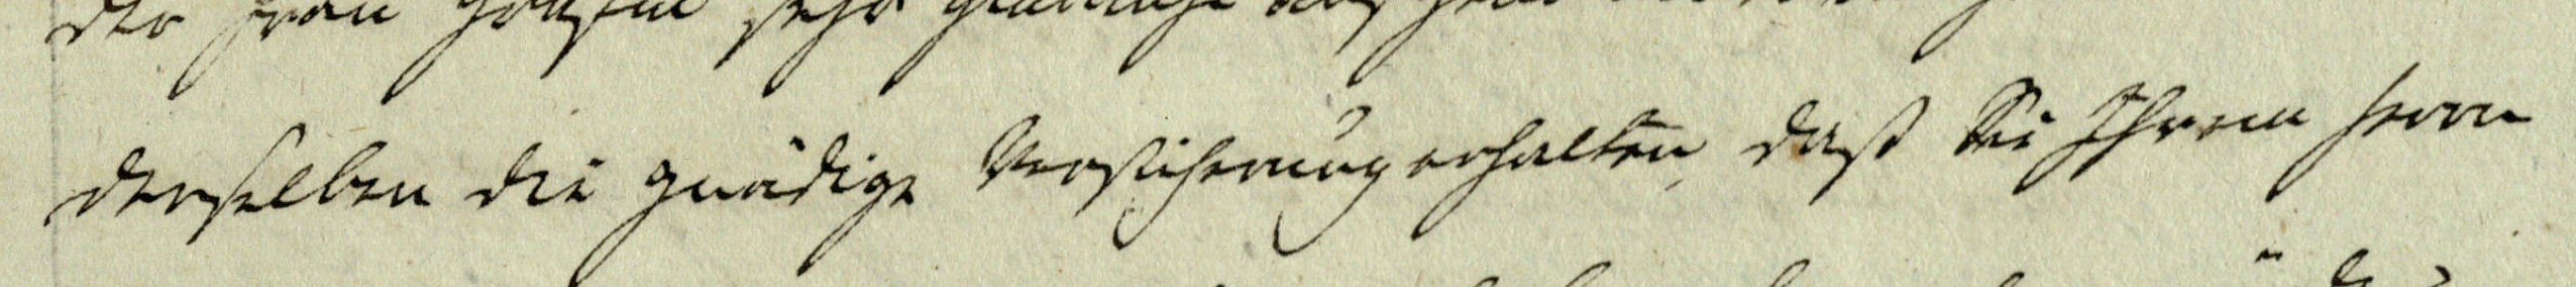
derselben die gnädige Versicherung erhalten, daß Sie Ihrem Herrn
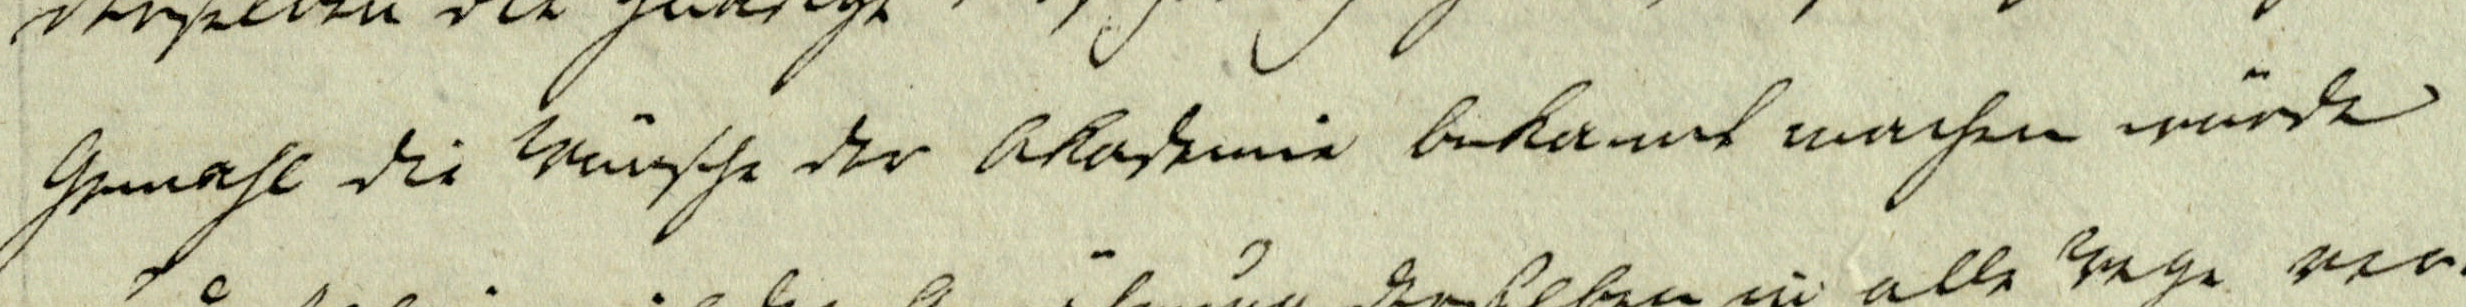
Gemahl die Wünsche der Akademie bekannt machen würde
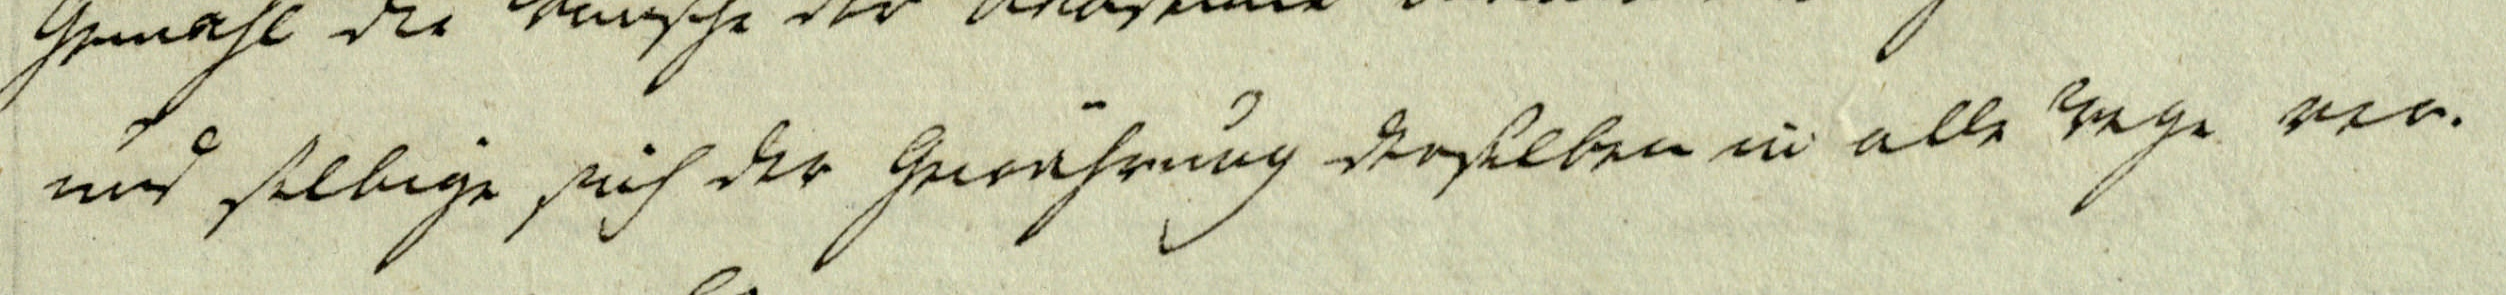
und selbige sich der Gewährung derselben in alle Wege ver¬
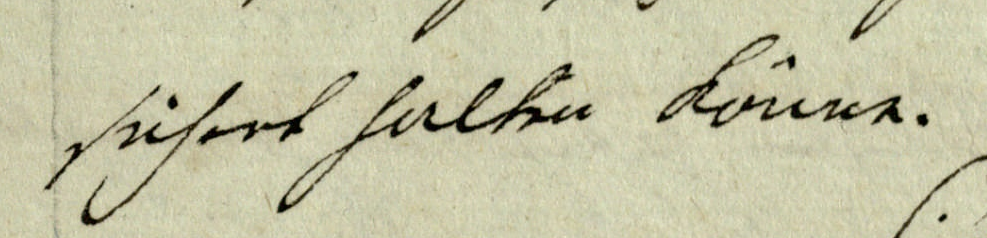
sichert halten könne.
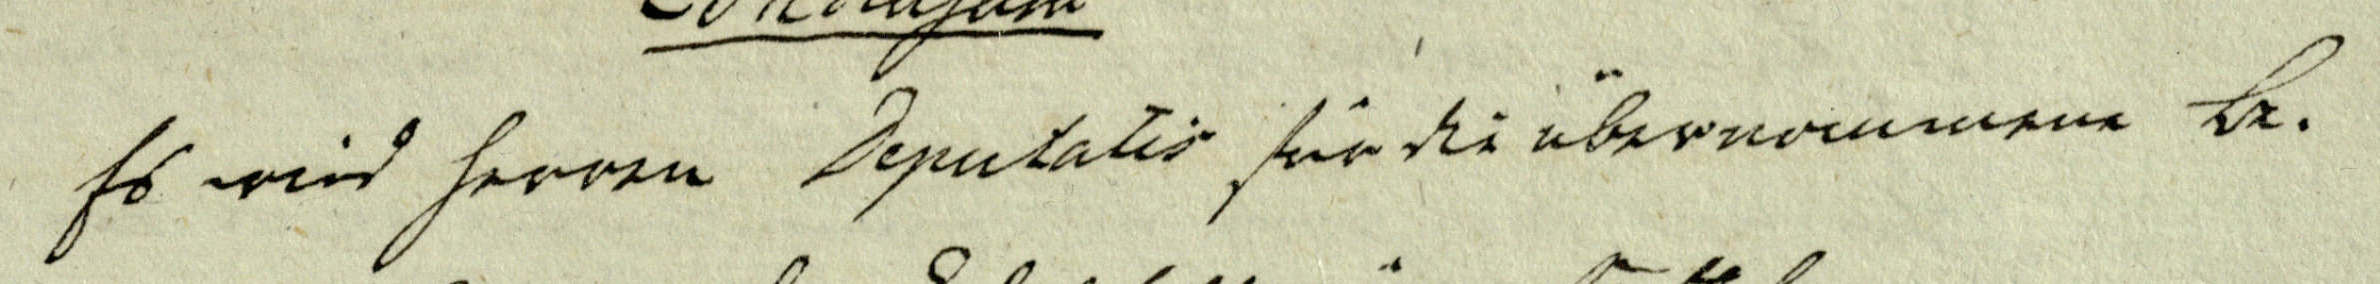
Es wird Herren Deputatis für die übernommene Be¬
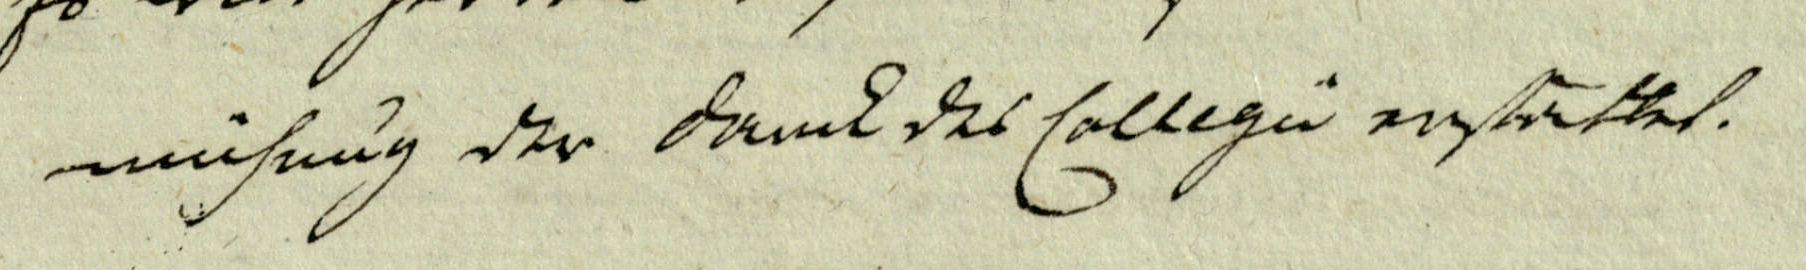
mühung der Dank des Collegii erstattet.
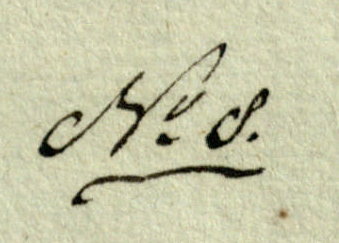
No 8.
